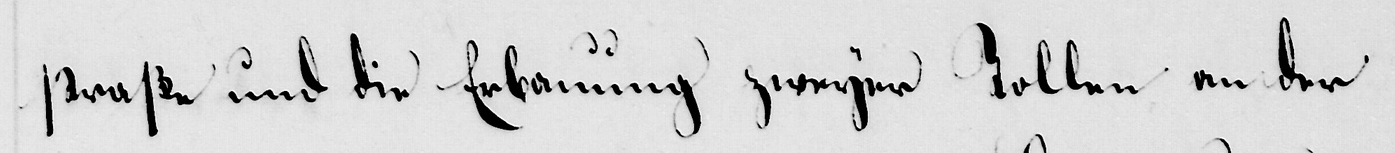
straße und die Erbauung zweyer Tollen an der
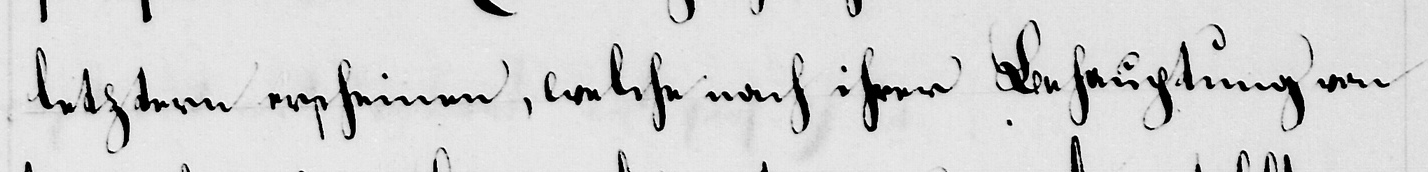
letztern erscheinen, welche nach ihrer Behauptung von
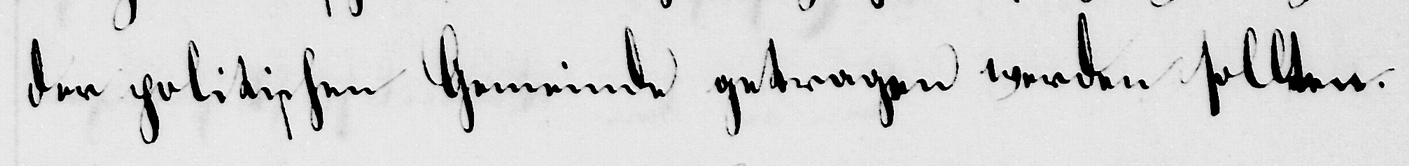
der politischen Gemeinde getragen werden sollten.
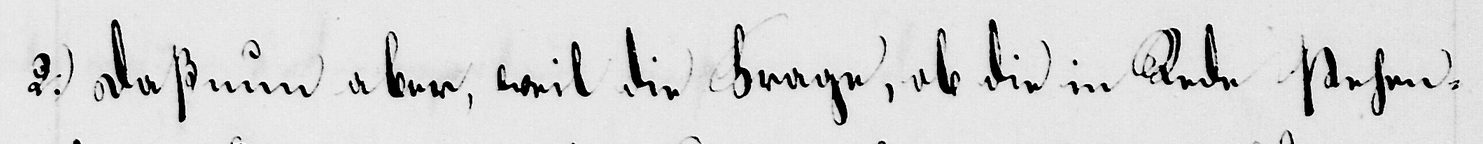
2.) Daß nun aber, weil die Frage, ob die in Rede stehen¬
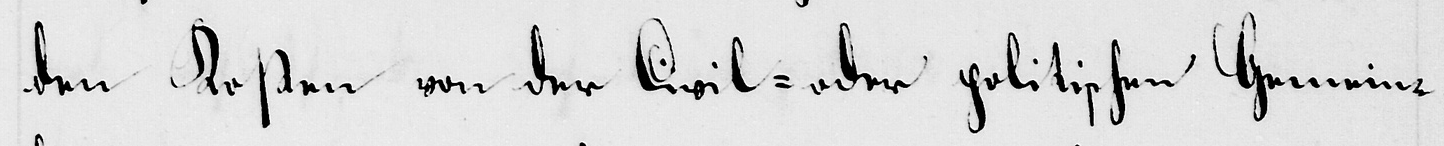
den Kosten von der Civil- oder politischen Gemein¬
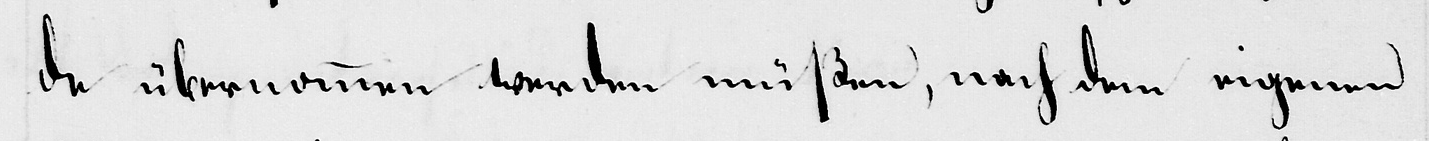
de übernommen werden müßen, nach dem eigenen
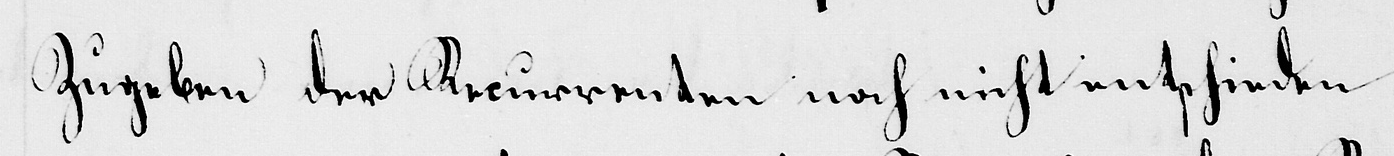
Zugeben der Recurrenten noch nicht entschieden
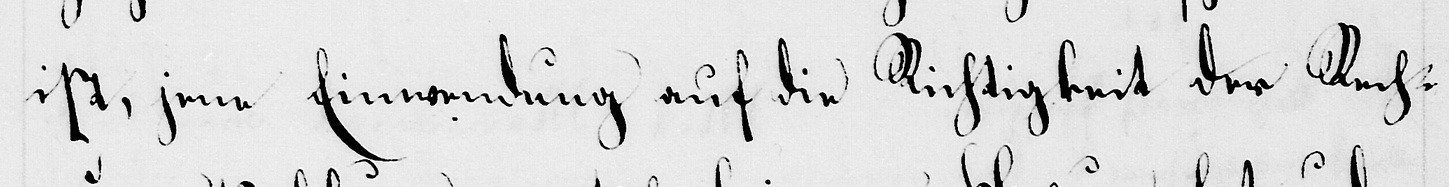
ist, jene Einwendung auf die Richtigkeit der Rech¬
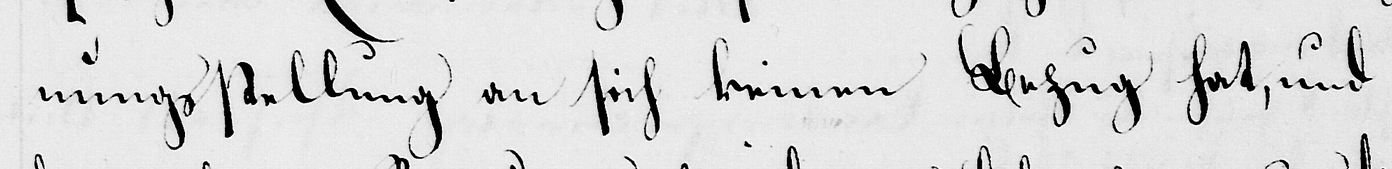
nungsstellung an sich keinen Bezug hat, und
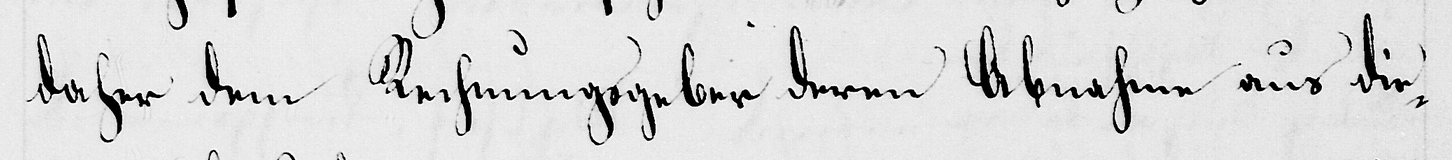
daher dem Rechnungsgeber deren Abnahme aus die¬
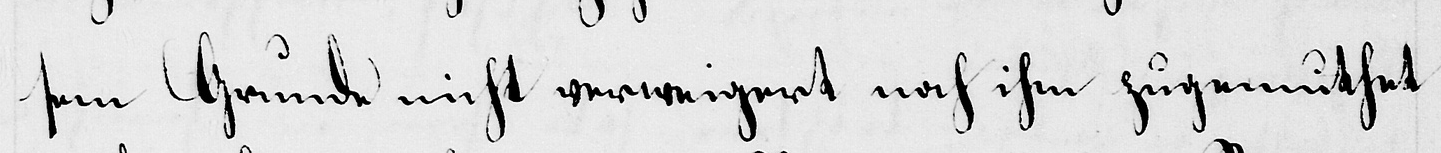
sem Grunde nicht verweigert noch ihm zugemuthet
